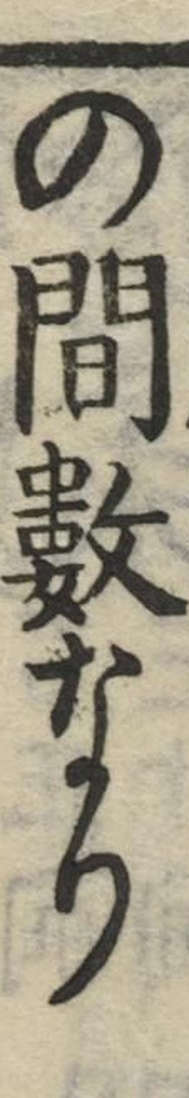の間数なり
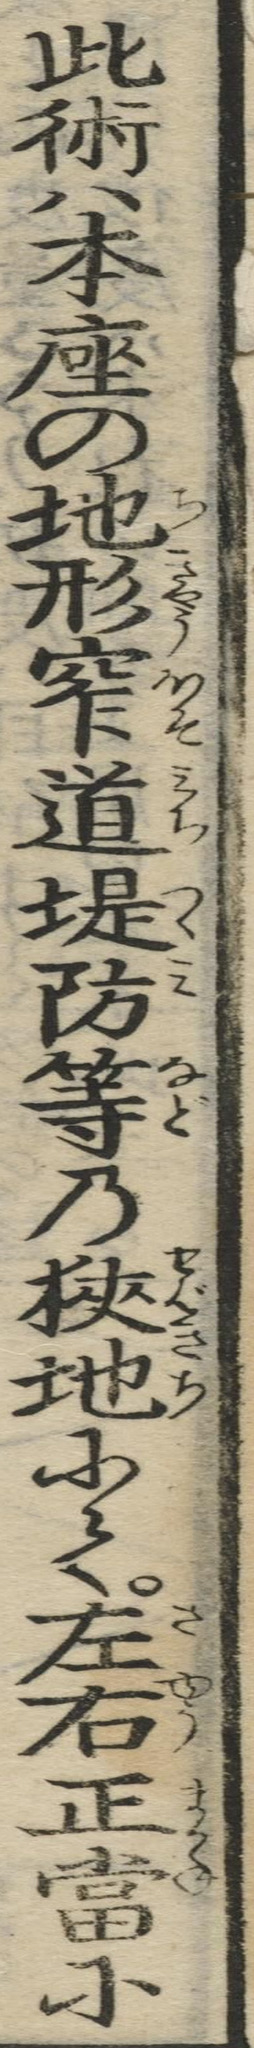此術は本座の地形窄道堤防等の狭地にて。左右正當に
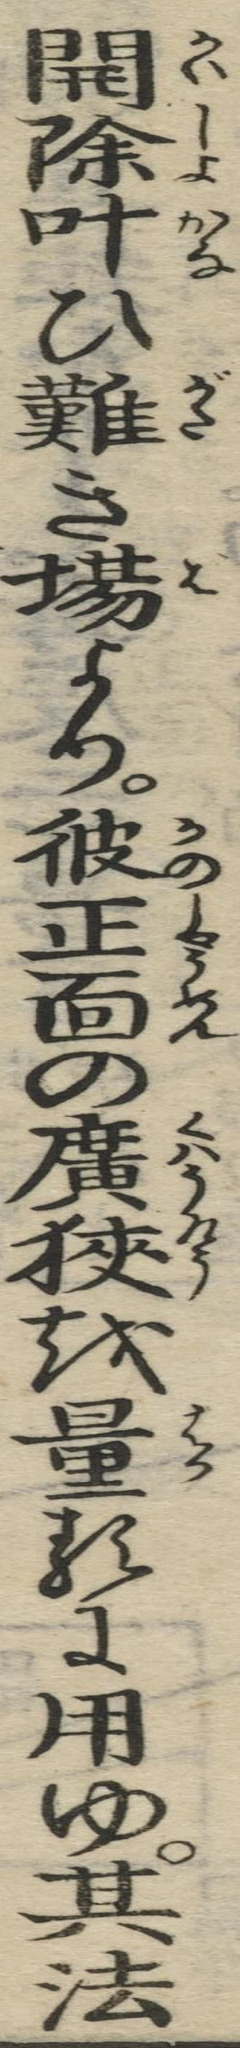開除叶ひ難き場より。彼正面の広狭を量るに用ゆ。其法
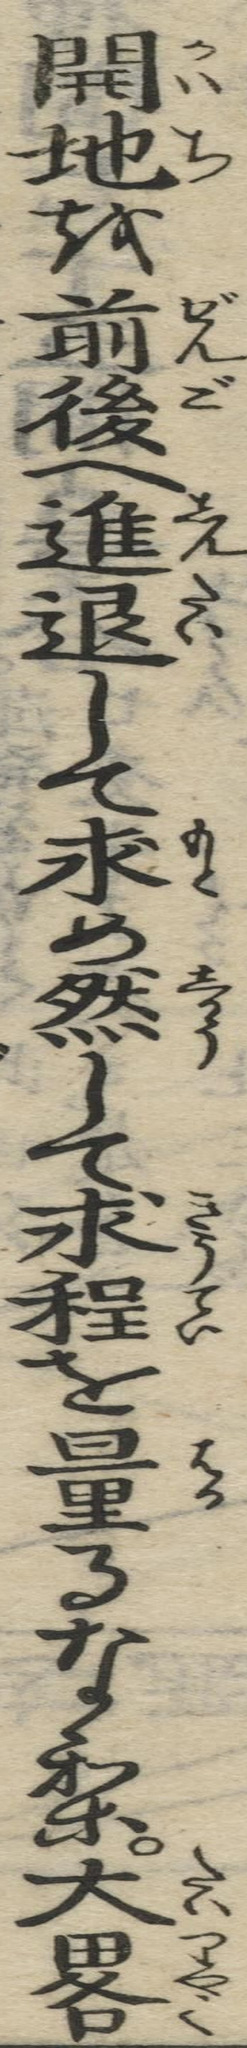開地を前後へ進退して求め然して求程を量るなり。大畧
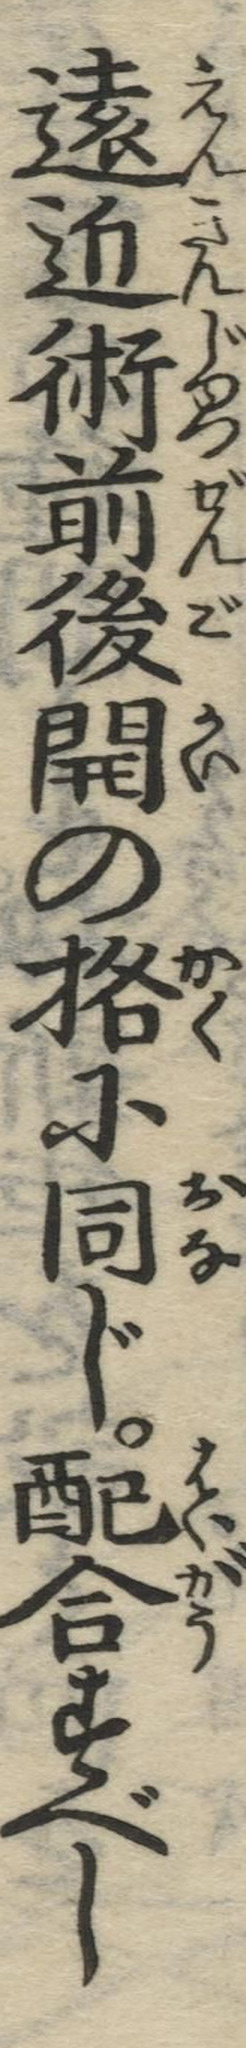遠近術前後開の格に同じ。配合すべし
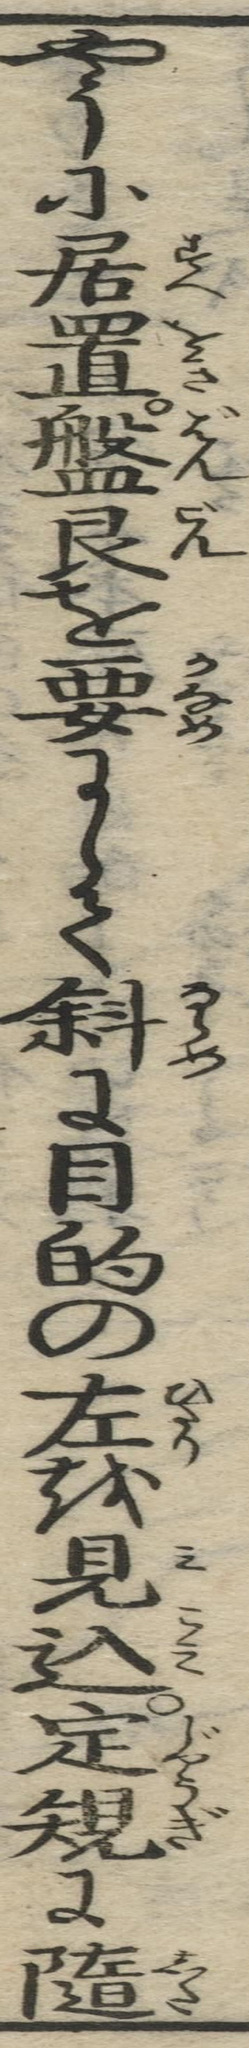やうに居置。盤艮を要にして斜に目的の左を見込。定規に随
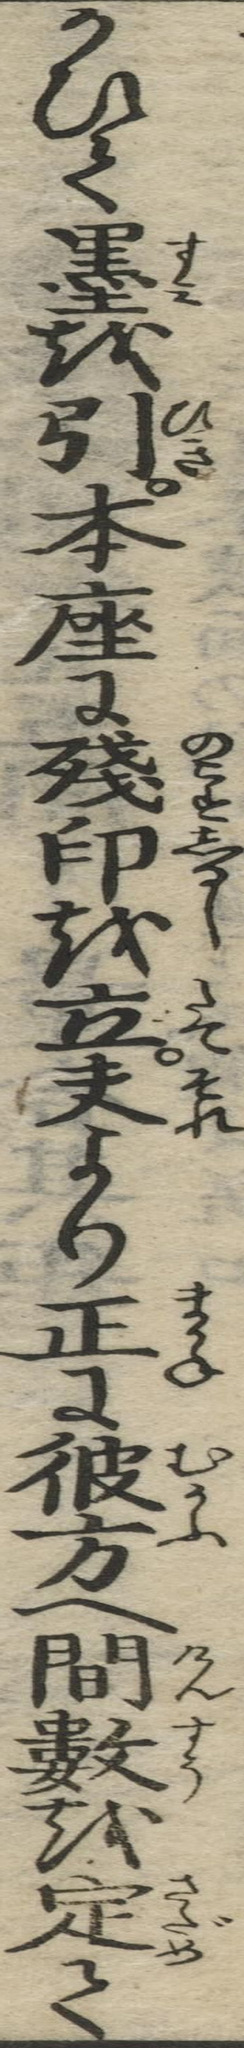かひて墨を引。本座に残印を立。夫より正に彼方へ間数を定て
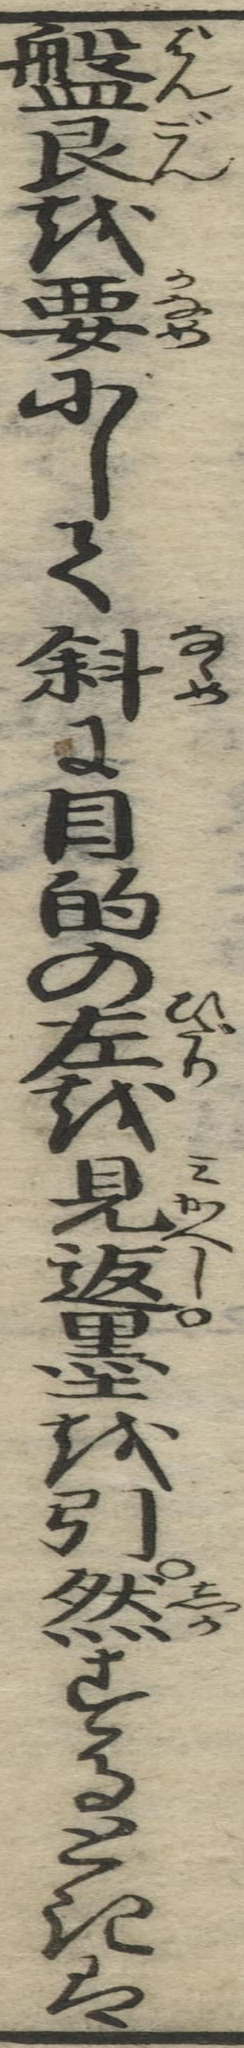盤艮を要にして斜に目的の左を見返。墨を引。然するときは

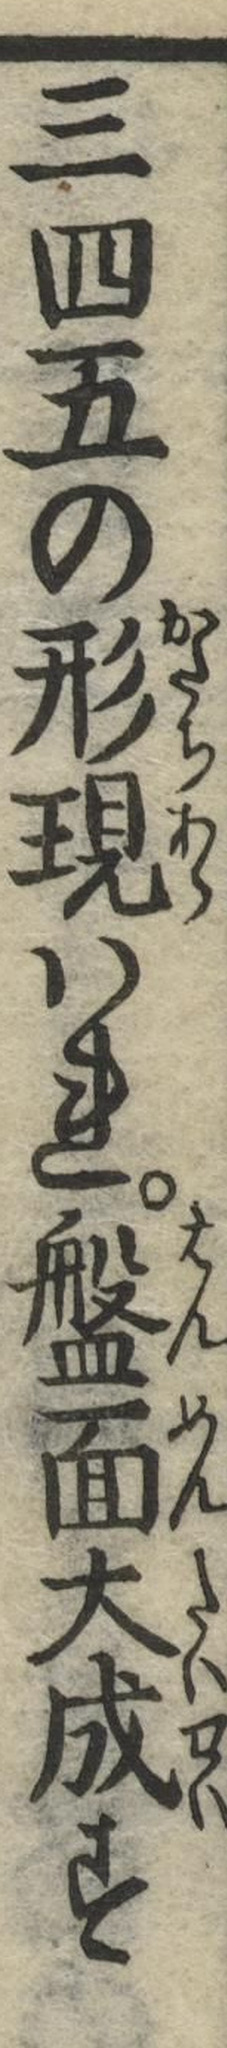三四五の形現はれ。盤面大成す
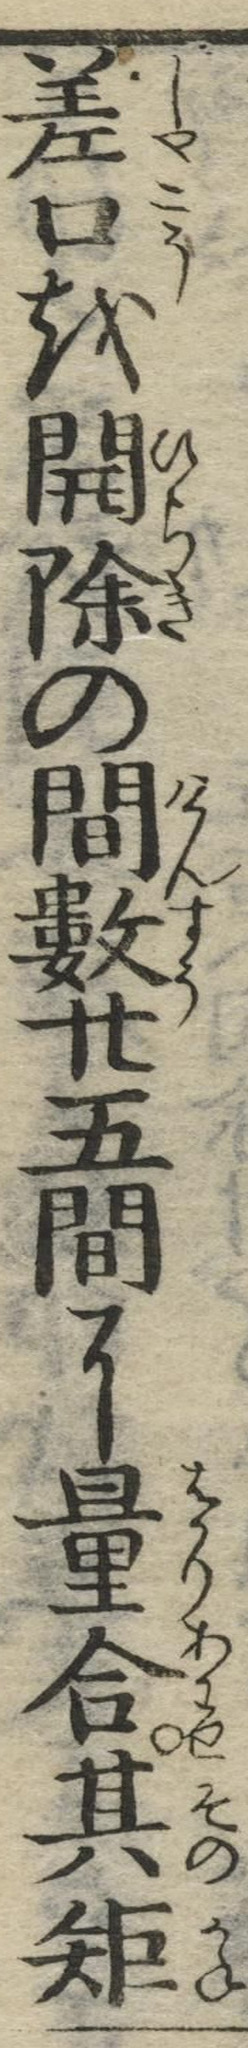差口を開除の間数廿五間に量合。其矩
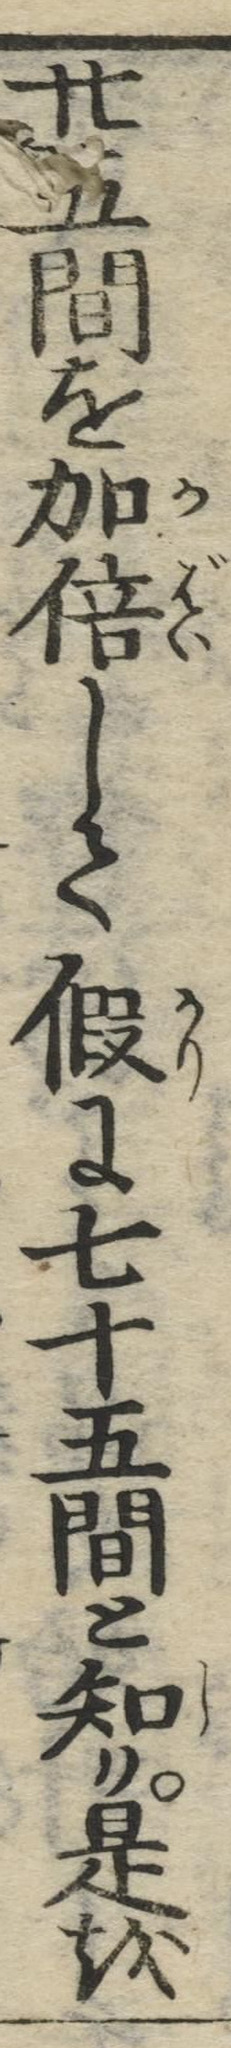廿五間を加倍して假に七十五間と知り。是を
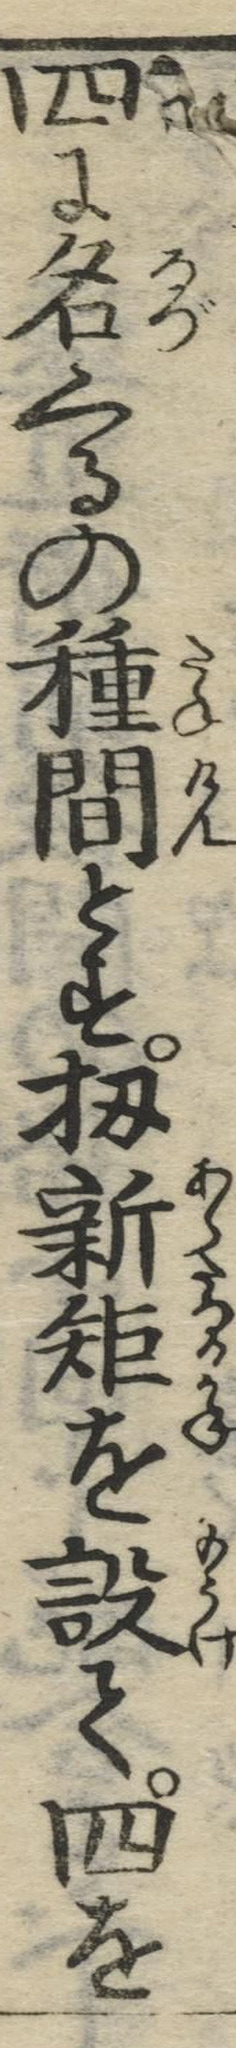四に名くるの種間とす。扨新矩を設て。四を
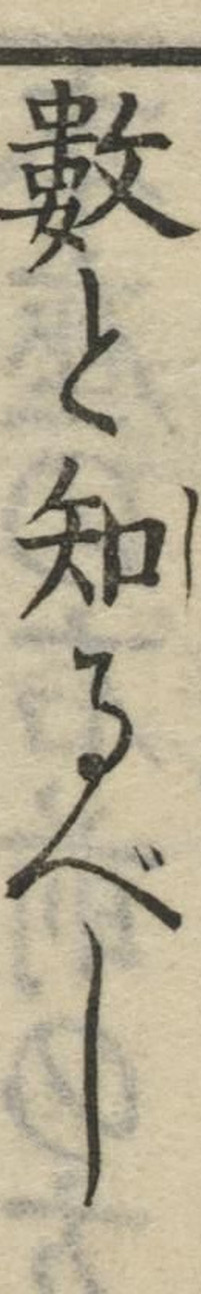数と知るべし
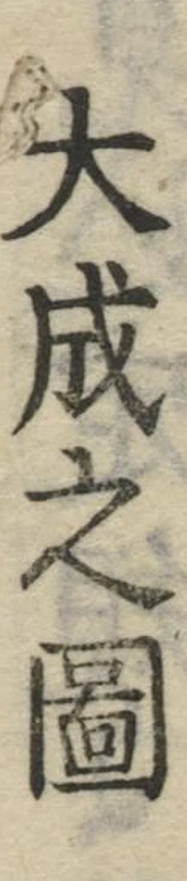大成之図
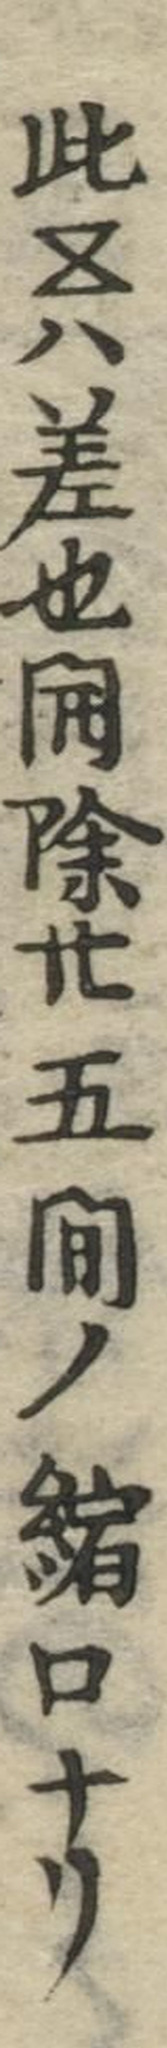此▽△ハ差也開除廿五間ノ縮口ナリ
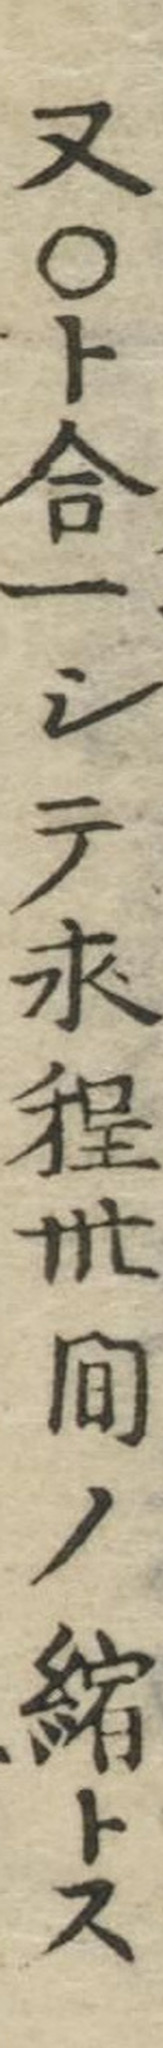又○ト合一シテ求程丗間ノ縮トス
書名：量地指南　巻之三（内題）
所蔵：東京大学地震研究所図書室 Earthquake Research Institute Library, The University of Tokyo, JAPAN
